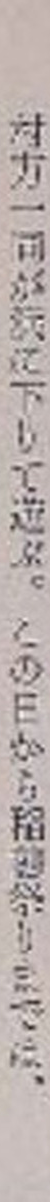村方一同が浜に下りて遊ぶ。この日から稲穂祭りまでは、
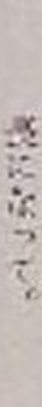長になって。
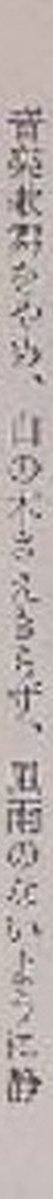音楽歌をやめ、山の木さえきらず、風雨のないように静
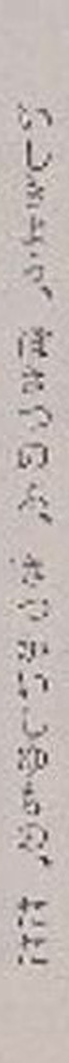いしきよら、ぼさつのふ、さつかいしゆもの、たた
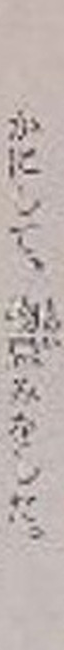かにして、物忌みをした。
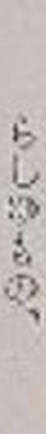らしゆもの、
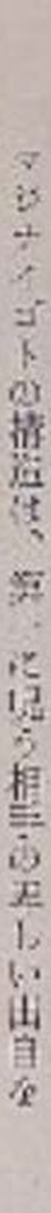マジナイゴトの構造は、第一に呪う相手の正しい出自を
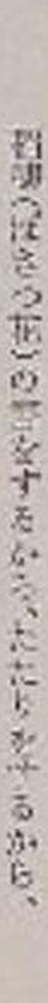稲穂(ぼさつ花)の害をするから、たたりをするから、
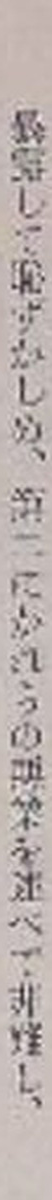暴露して恥ずかしめ、第二にかれらの悪業を述べて非難し、
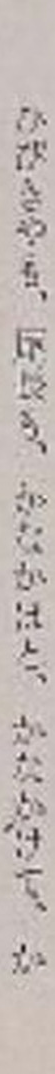ひびきやも、尾長も、かなかはと、かなかけて、か
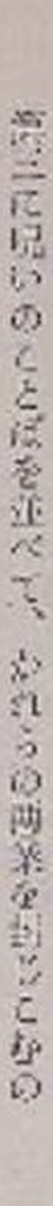第三に呪いのことばを並べて、かれらの悪業を封じこむの
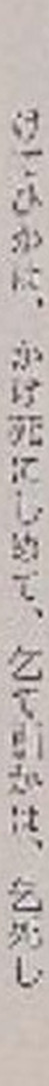けてひかは、かけ死にしめて、乞て引かは、乞死し
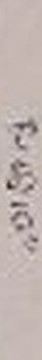である。
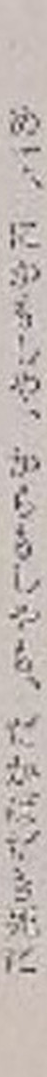めて、にかもしや、からもしやも、だかばだき死に
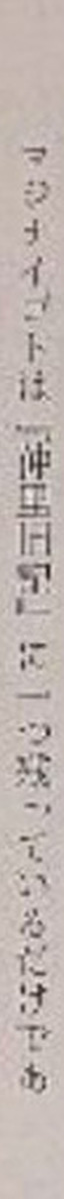マジナイゴトは『仲里旧記』に一つ残っているだけであ
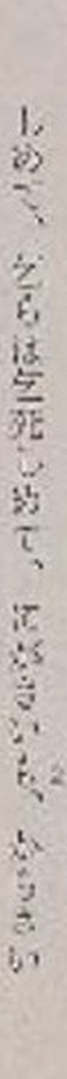しめて、乞らは乞死しめて、にがさいも、からさい
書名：沖縄口承文芸
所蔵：University of the Ryukyus Library
